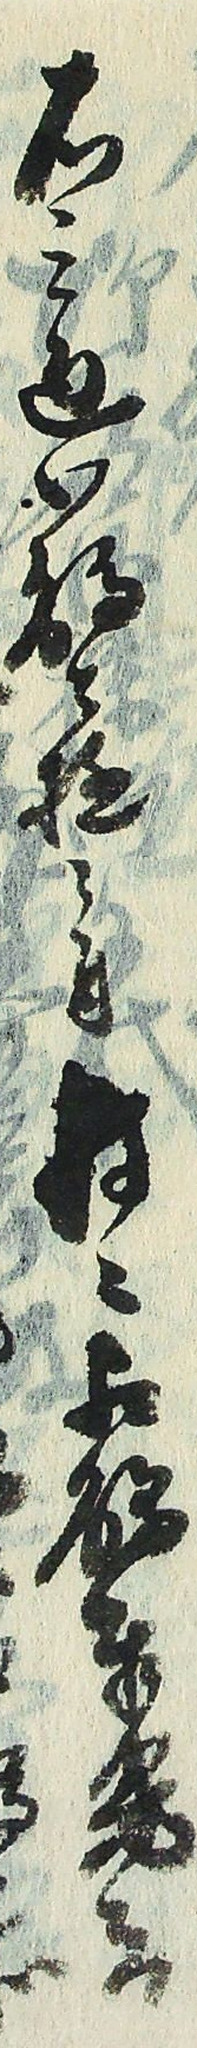右之通御触被遊候に付村々相触奉畏旨
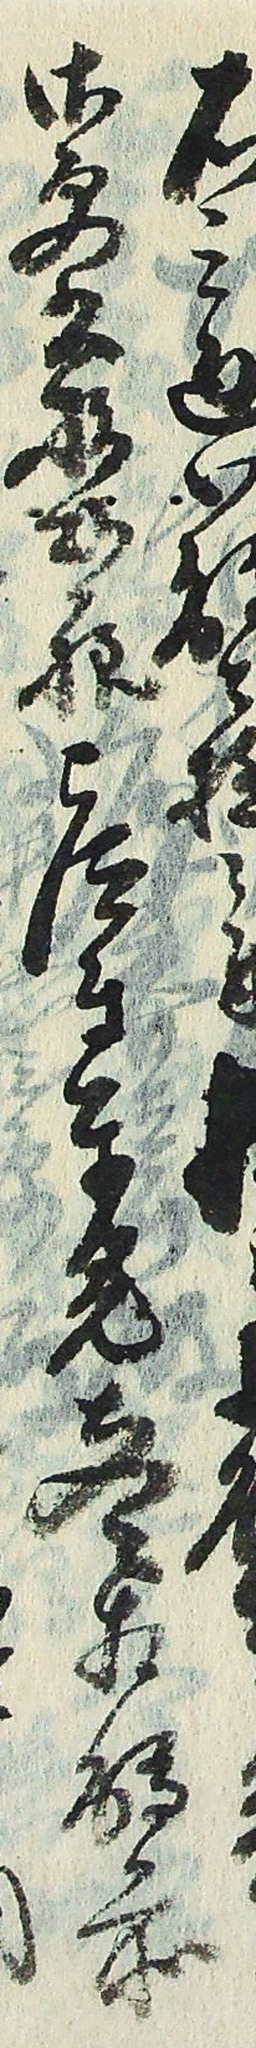御受書指出候様被仰付奉畏夫々相触候所
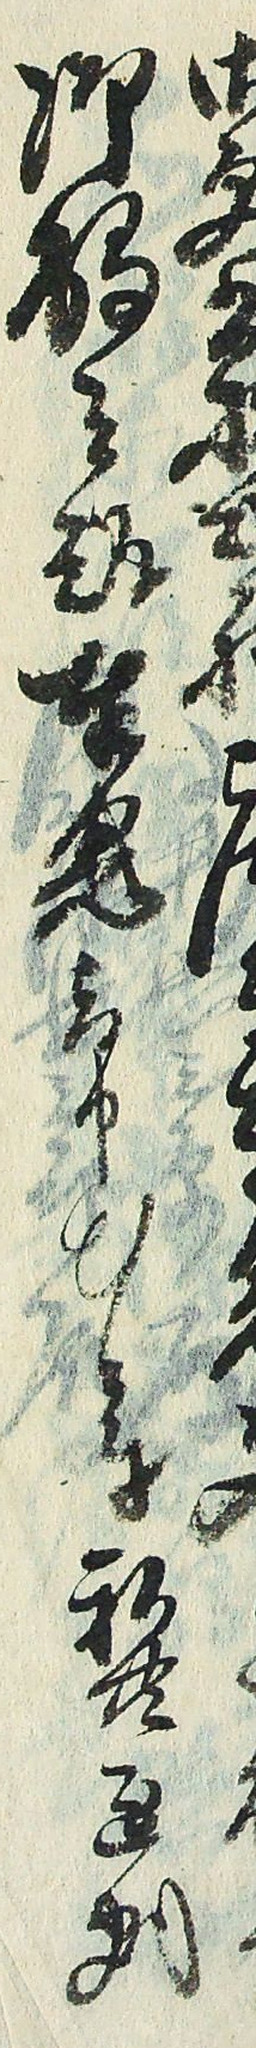御触之趣奉畏旨申出候に付私共連判

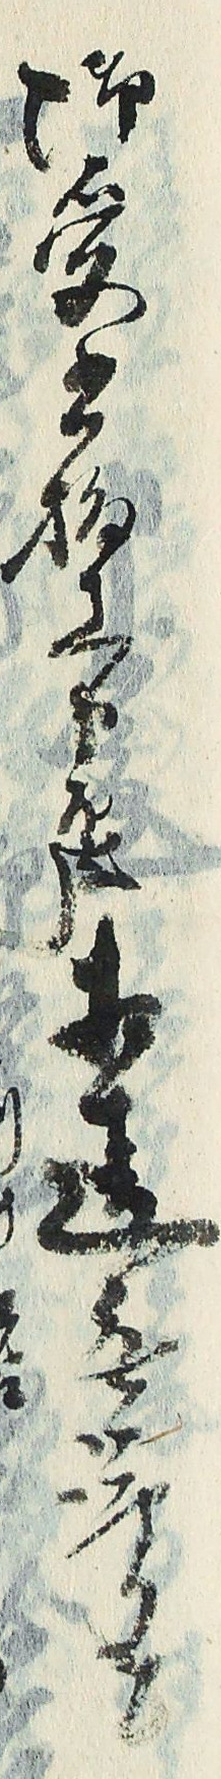御受書指上申処相違無御坐候以上
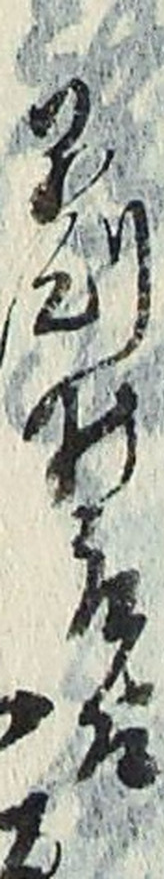早淵村庄屋
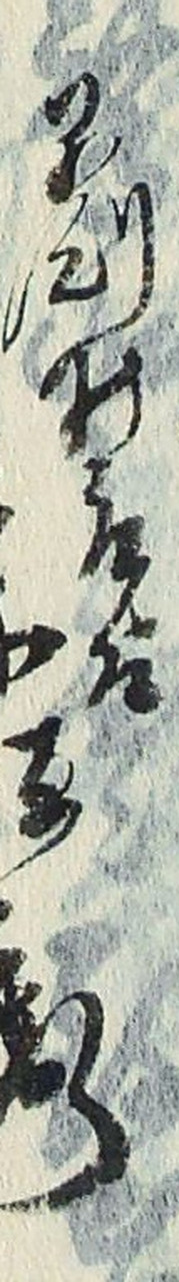早淵村庄屋
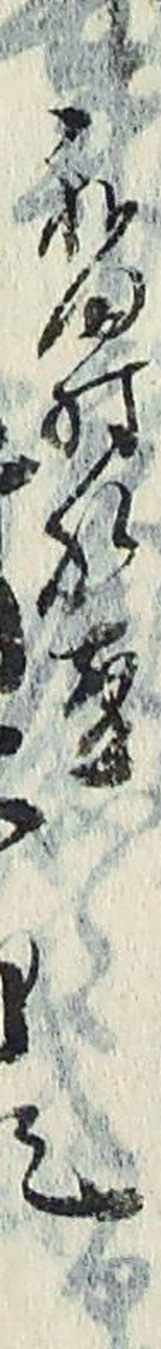和田村肝煎
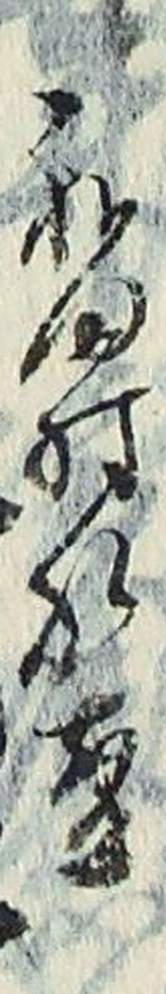和田村肝煎
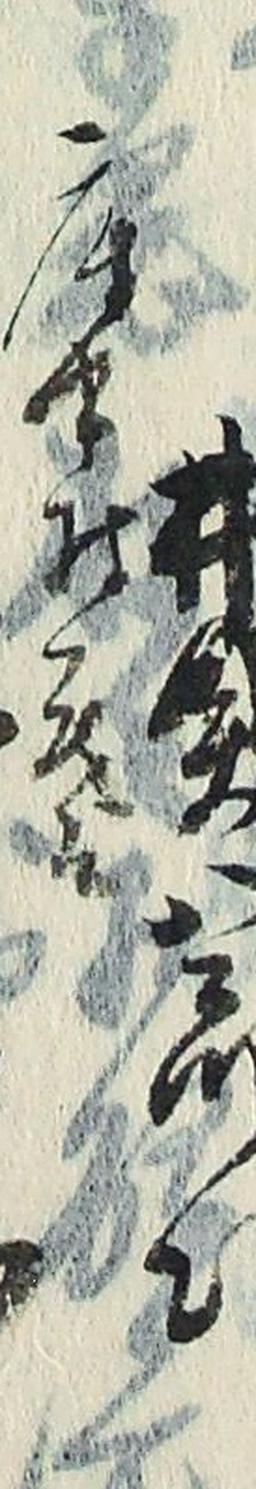府中村庄屋
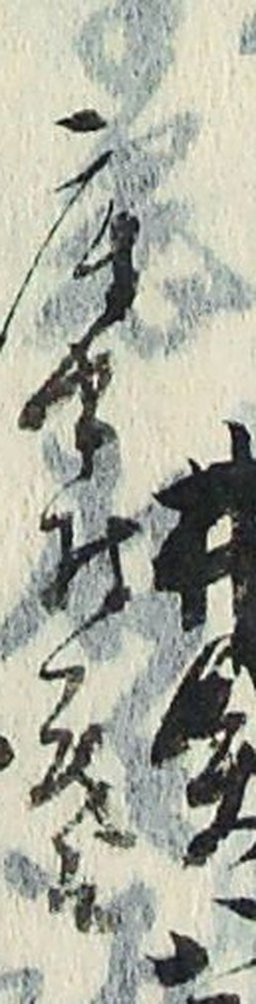府中村庄屋
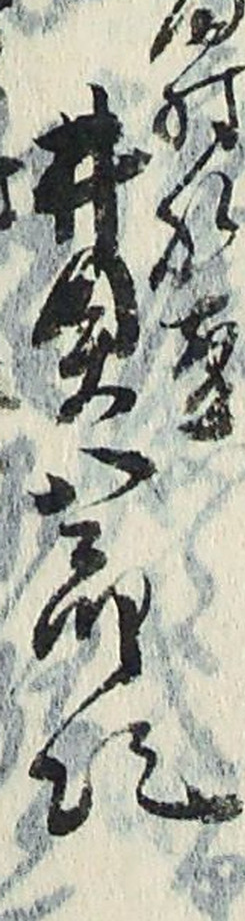井貝八郎次
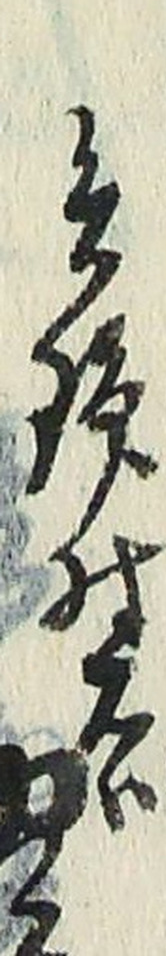矢野村右同
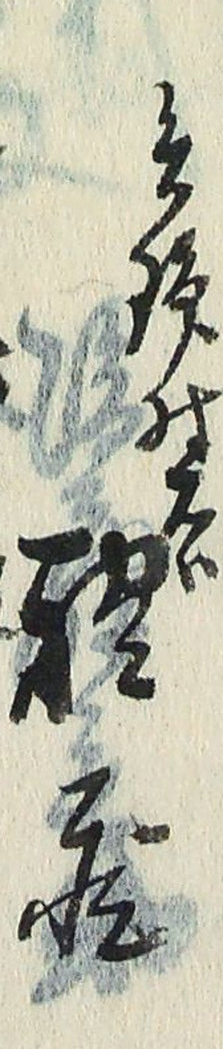矢野村右同
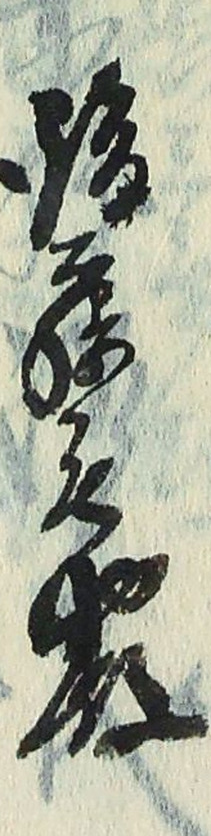後藤庄助殿
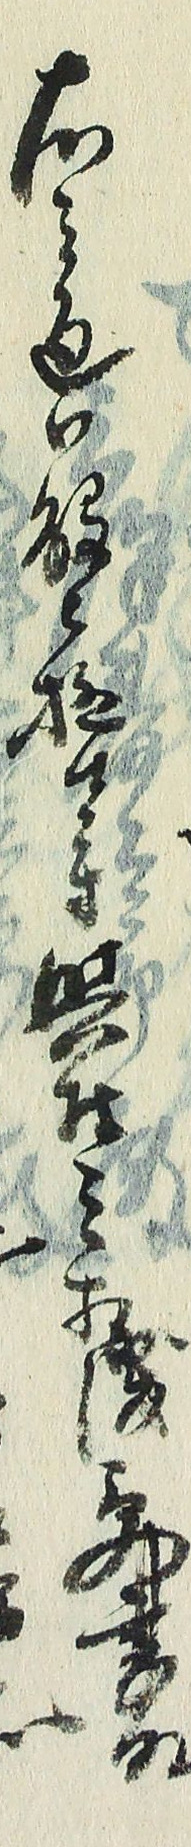右之通御触被遊候に付与村々相洩受書取
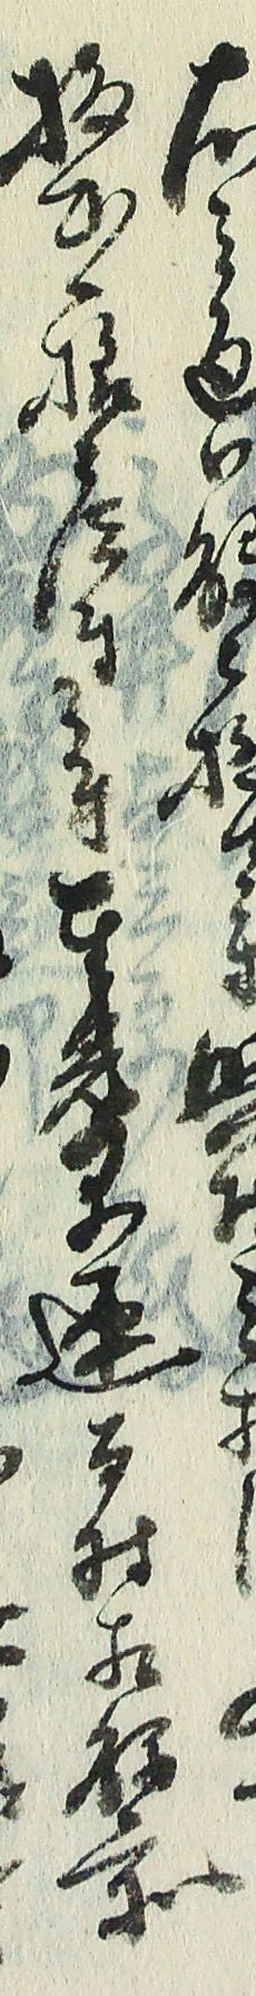指出候様被仰付候に付奉畏早速与村相触候所
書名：諸御用御□受書控
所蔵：鳴門教育大学 Naruto University of Education
